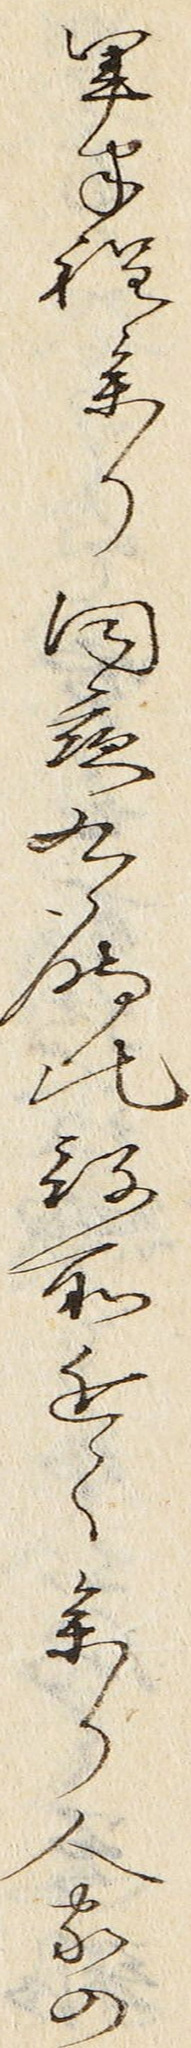里半程参り同夜九ッ時比役所近く参り人家の
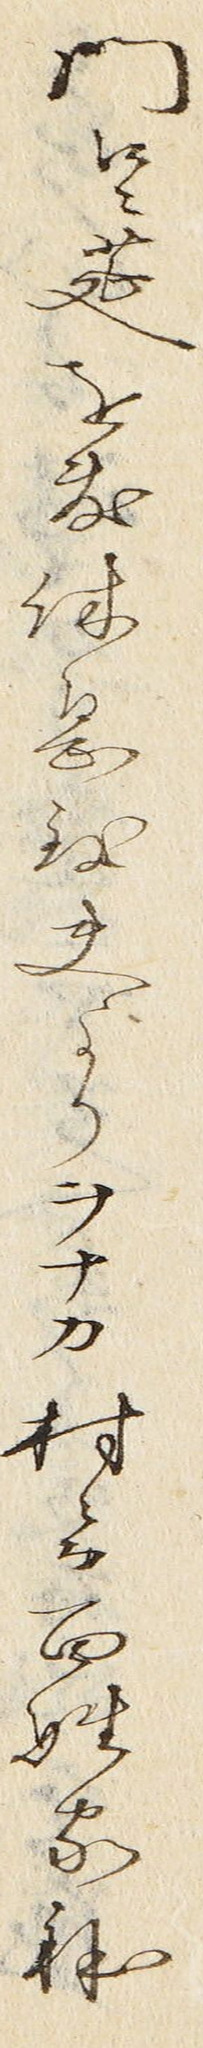門口に莚を敷休息致其夫よりヲナカ村に而百姓家躰
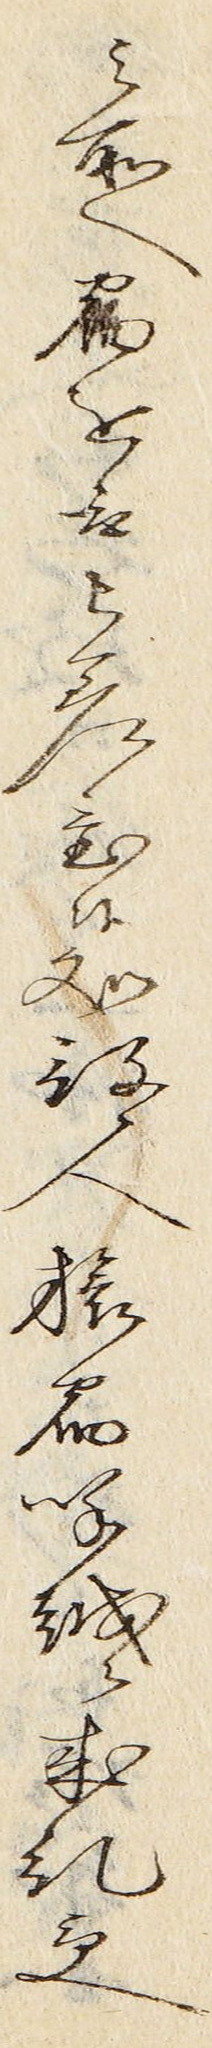之所へ宿を取被差置候処役人旅宿呼越被成糺受
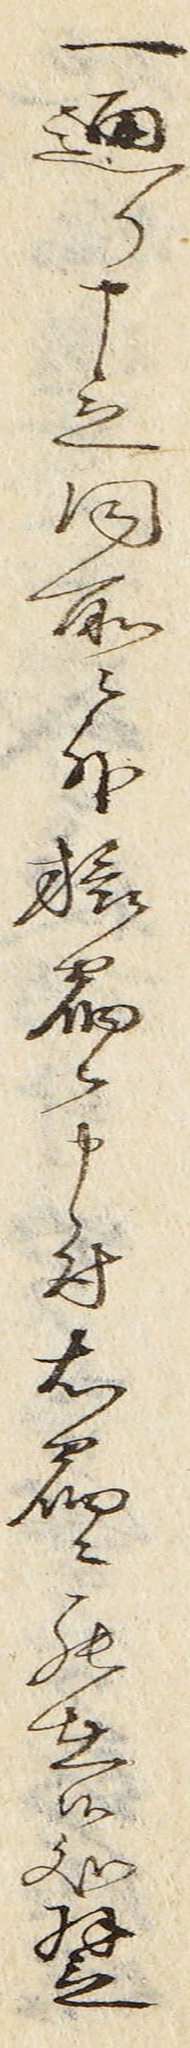一通り申立同所之外旅宿被申付右宿に罷在候処翌
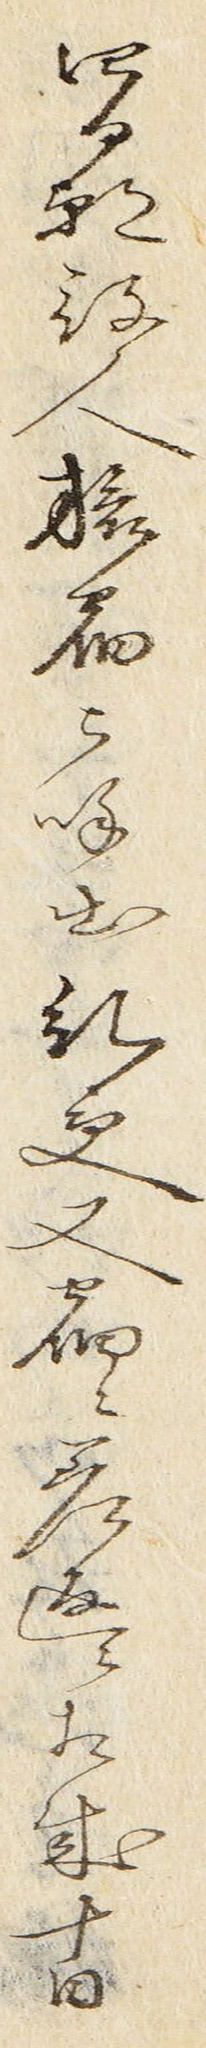四日朝役人旅宿に呼出糺受又宿に差返に相成十日
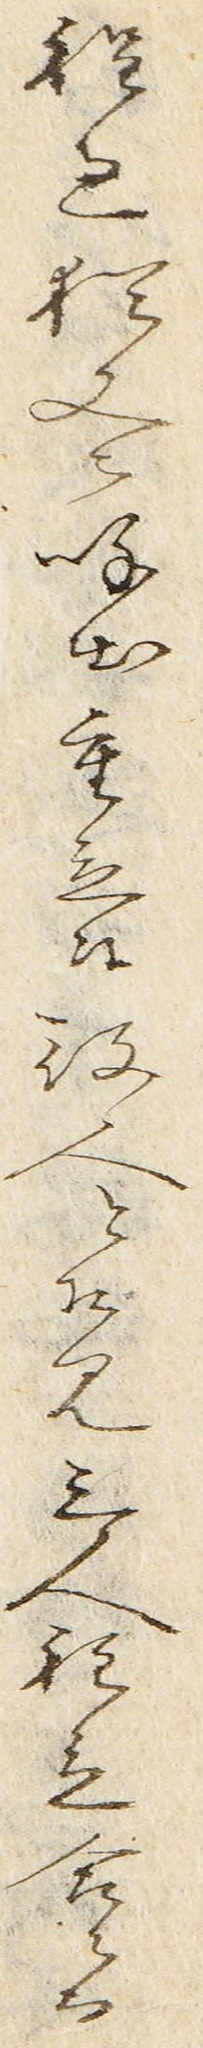程過猶又被呼出重立之役人と相見三人程立合に而
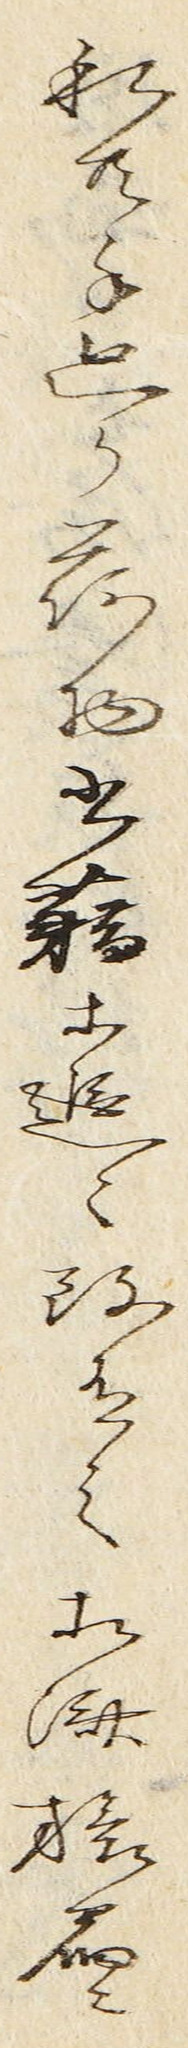私共手廻り荷物書籍等追々改有之相済旅宿に
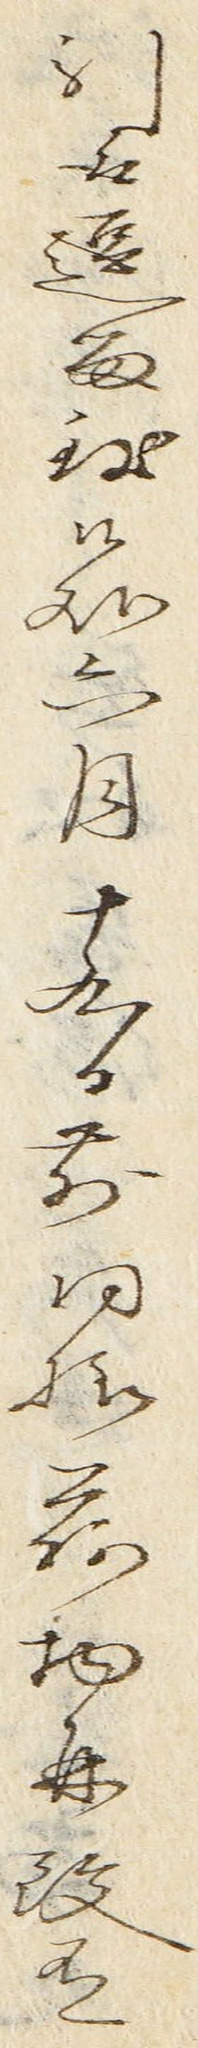引取逗留致候処六月十九日前同様荷物再改有
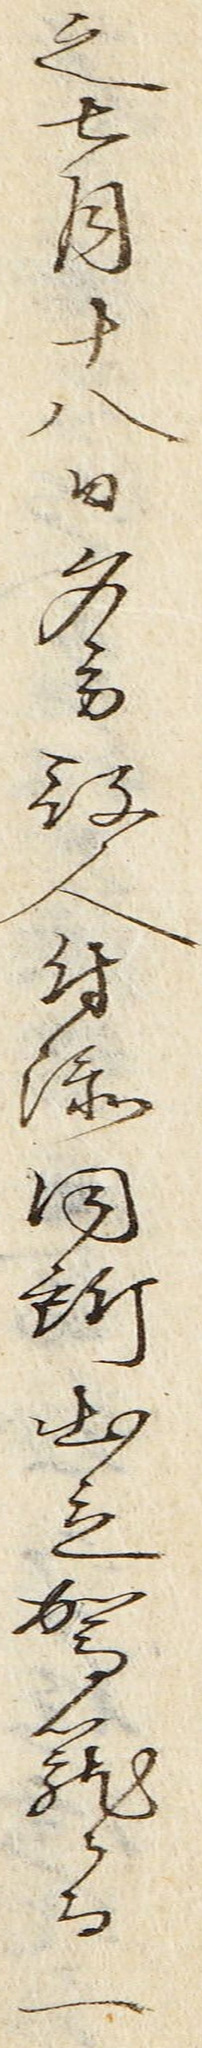之七月十八日夕方役人付添同所出立駕籠に而一
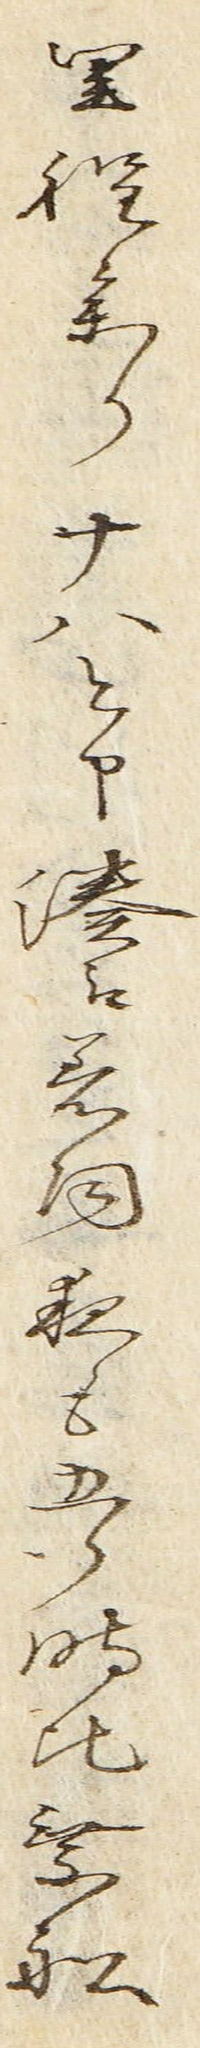里程参りナハと申湊え着同夜も五ッ時比乗船

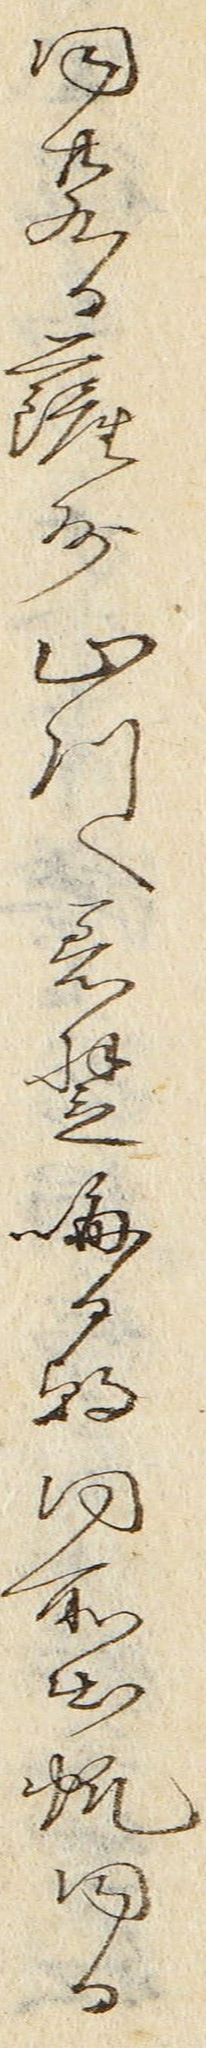同廿九日薩州山川へ着翌晦日朝同所出帆同日
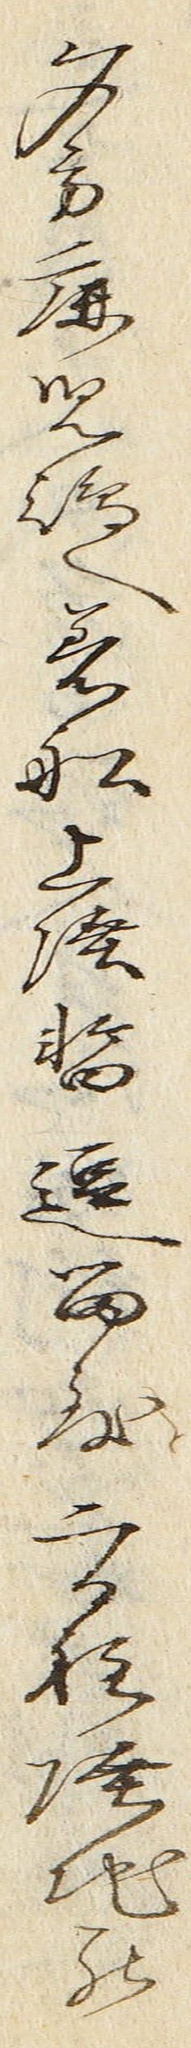夕方鹿児島へ着船上陸暫逗留致二日程陸地罷
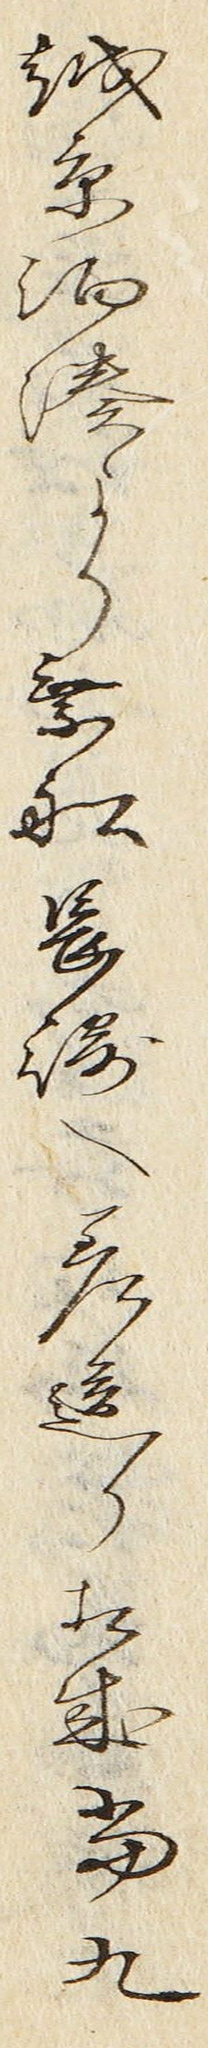越京泊湊より乗船長崎へ差送り相成当九
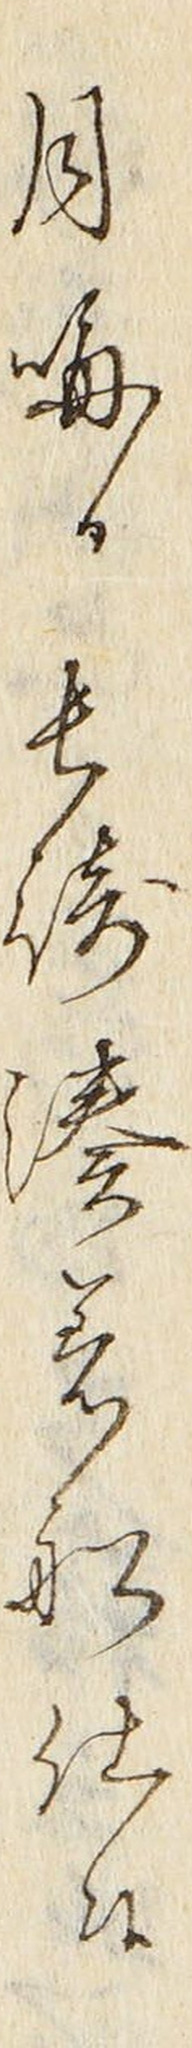月晦日長崎湊着船仕候
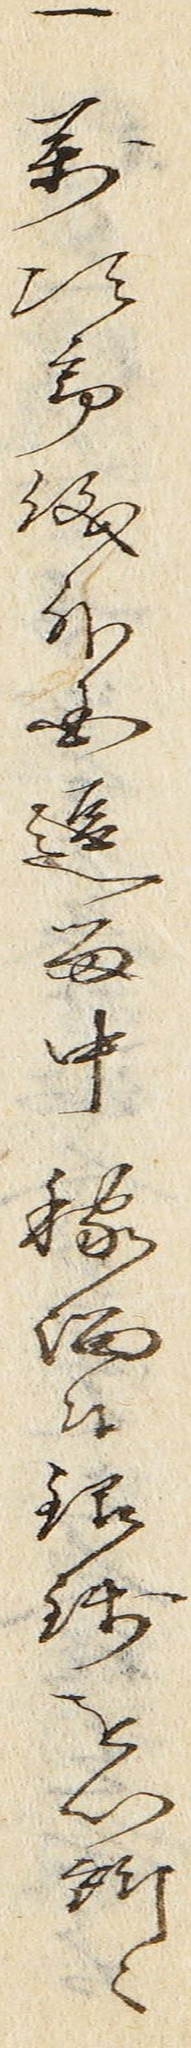一万次郎儀外国逗留中稼溜候銀銭を以所々
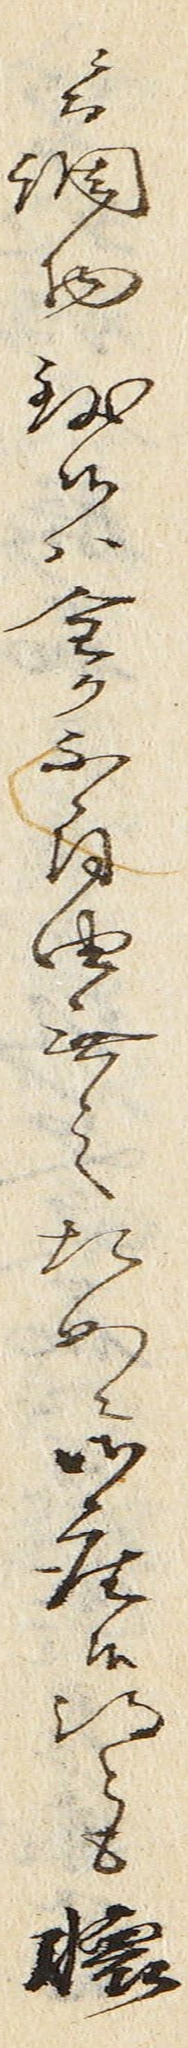に而調物致候は全く不自由無之ために御座候得とも懐
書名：土佐中浜万次郎漂流記
